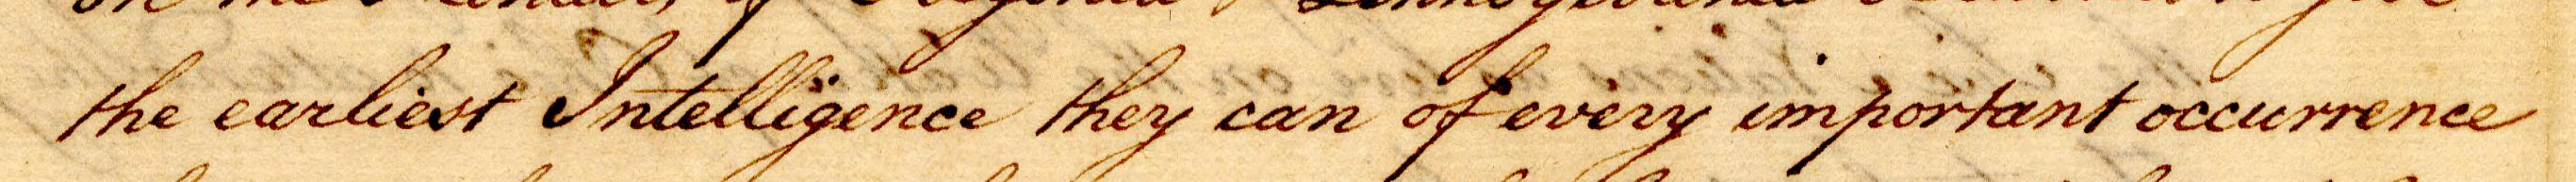the earliest Intelligence they can of every important occurrence
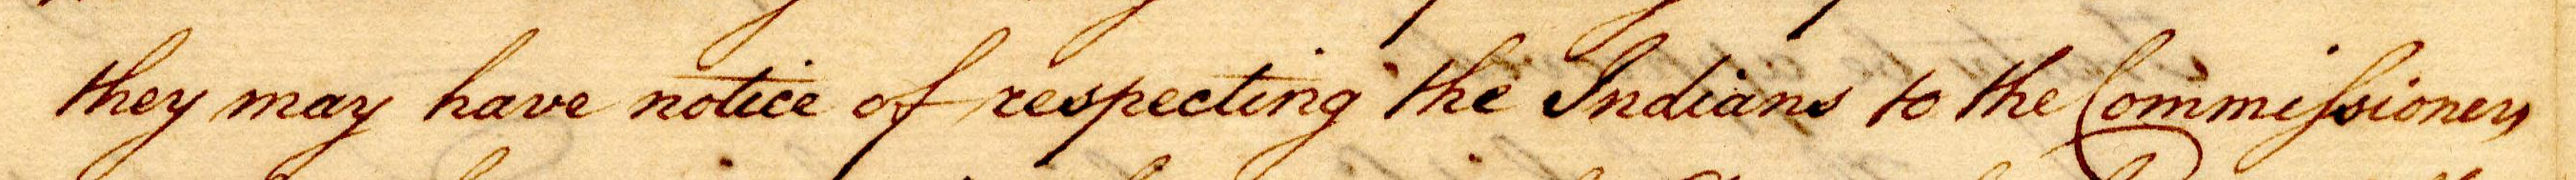they may have notice of respecting the Indians to the Commissioners
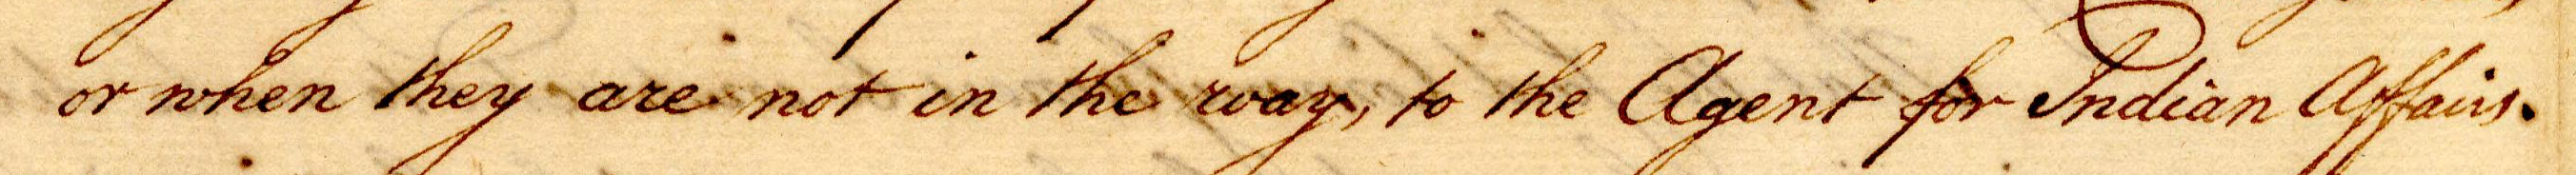or when they are not in the way, to the Agent for Indian Affairs.
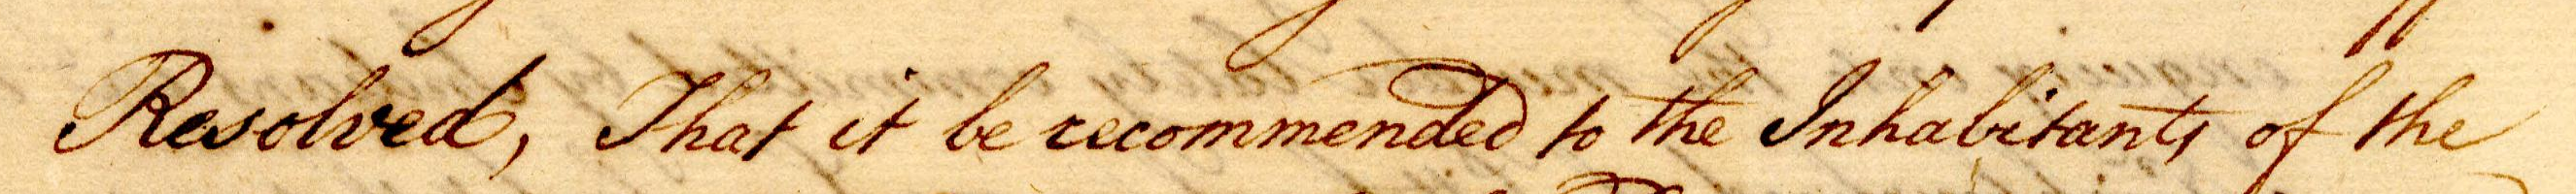Resolved, That it be recommended to the Inhabitants of the
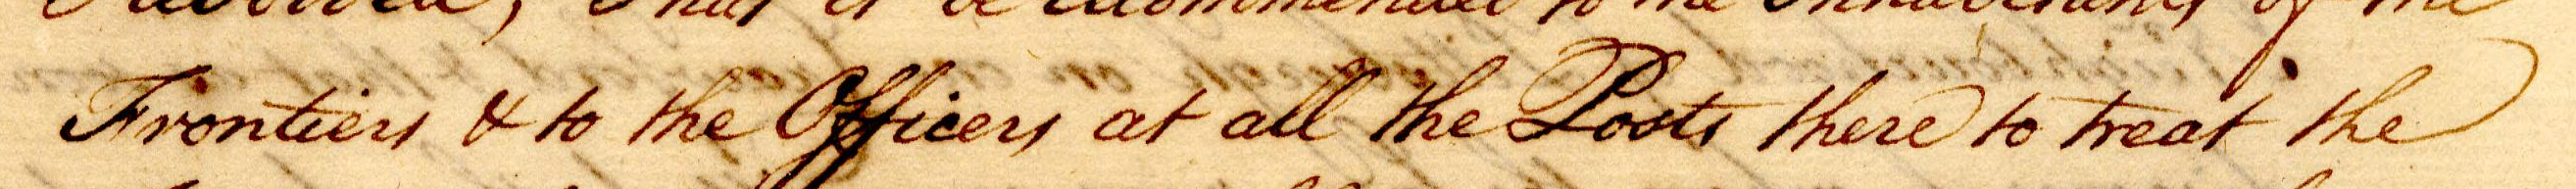Frontiers & to the Officers at all the Posts there to treat the
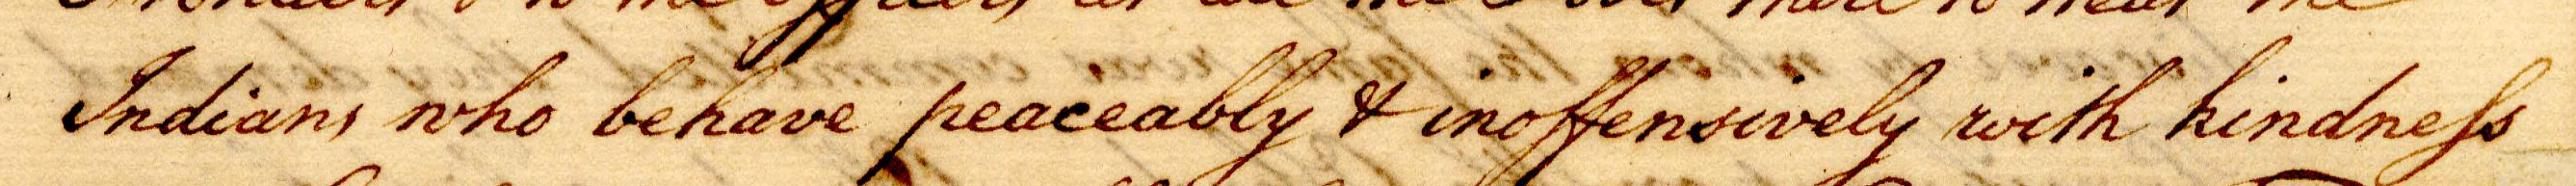Indians who behave peaceably & inoffensively with kindness
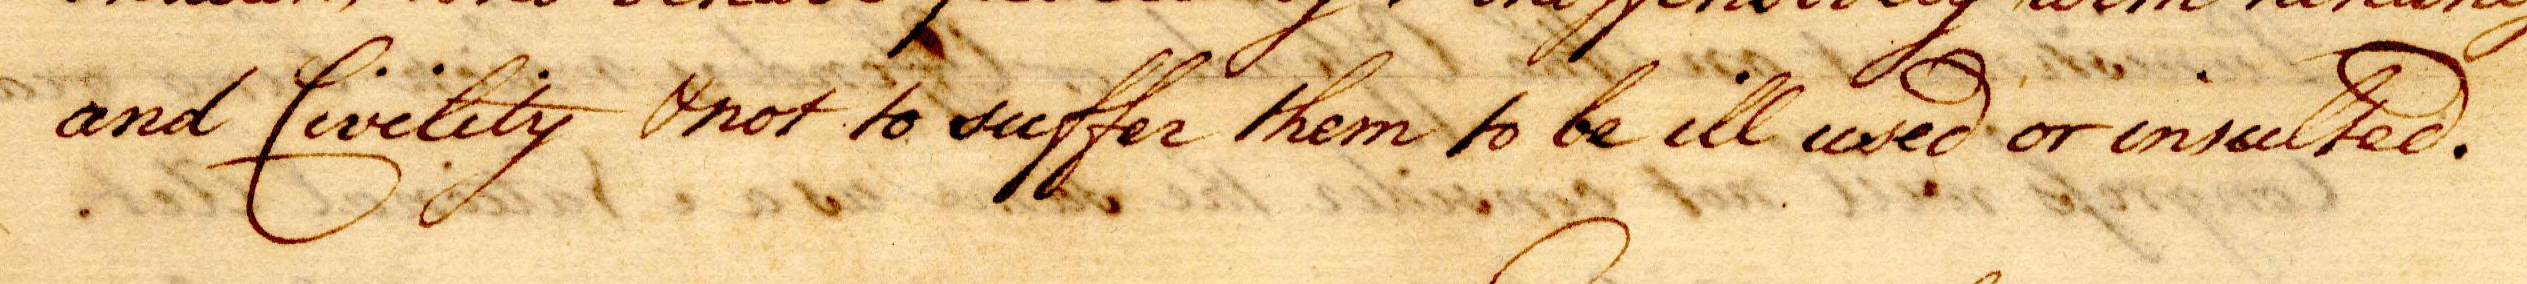and Civility not to suffer them to be ill used or insulted.
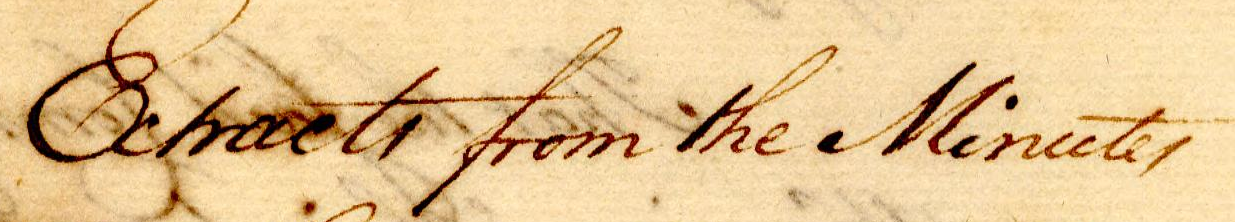Extracts from the Minutes
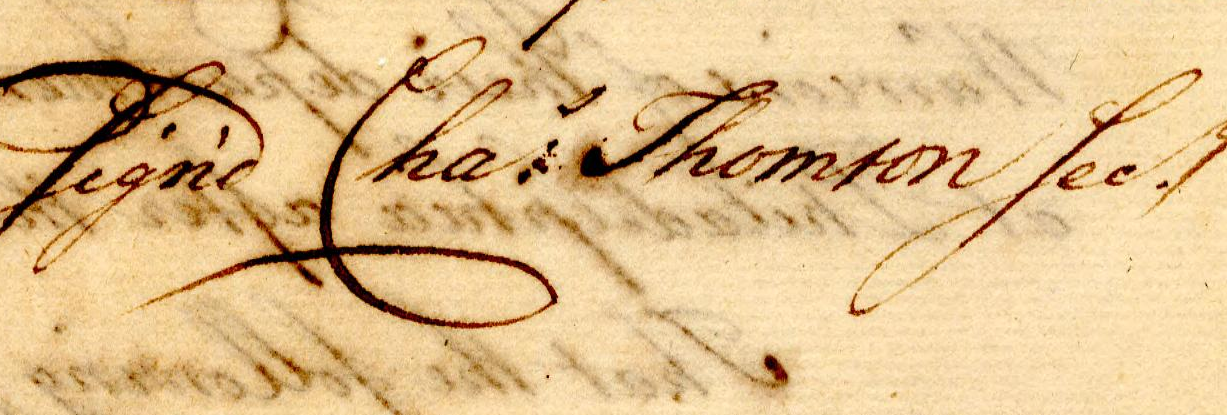Sign'd Cha^s Thomson Sec^y
